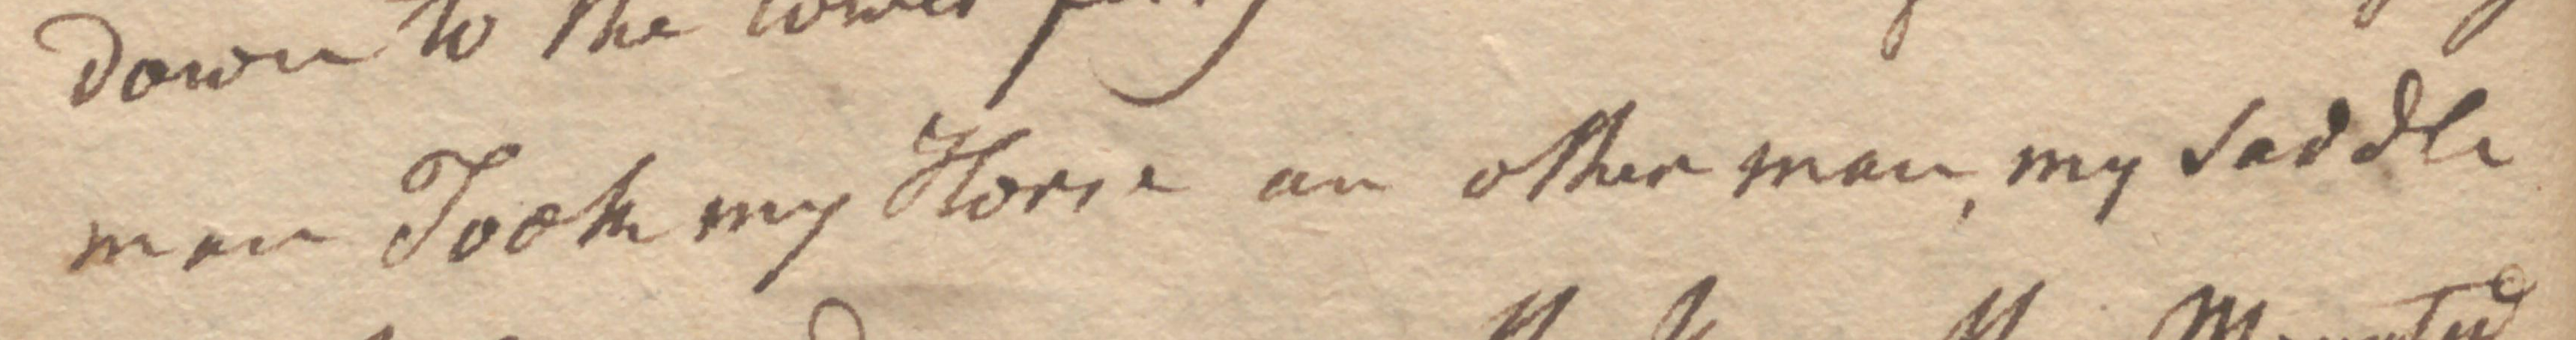man Took my Horse an other man my saddle
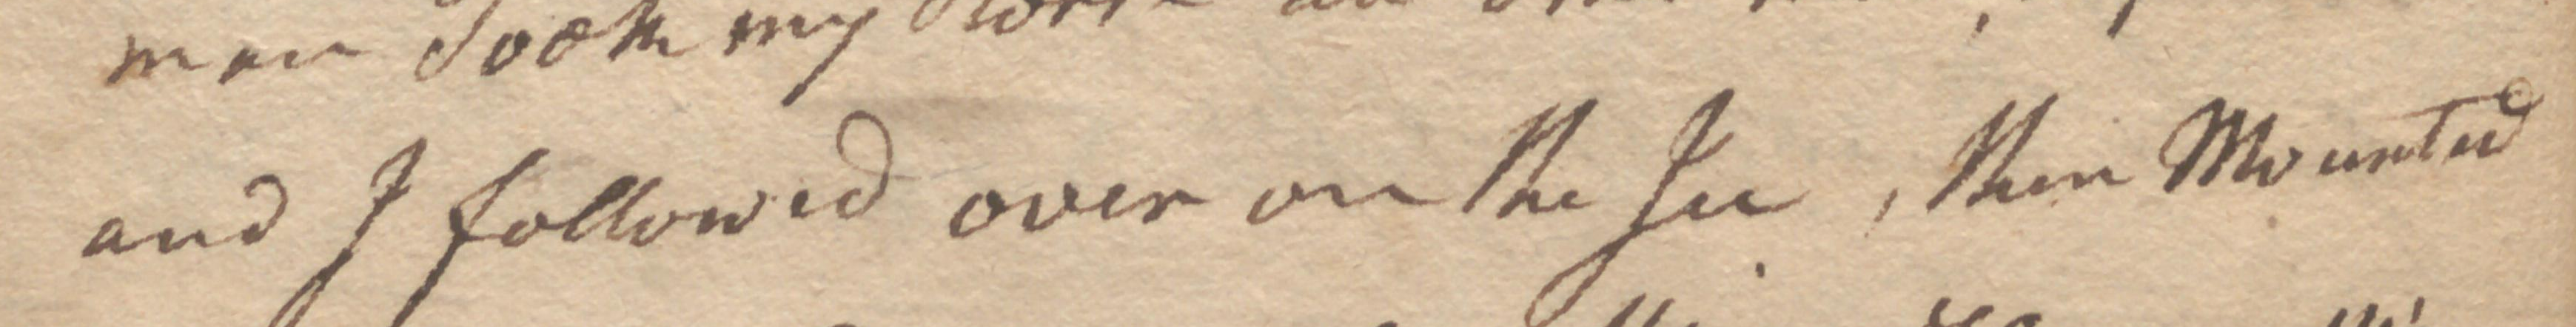and I followed over on the Ice, then Mounted
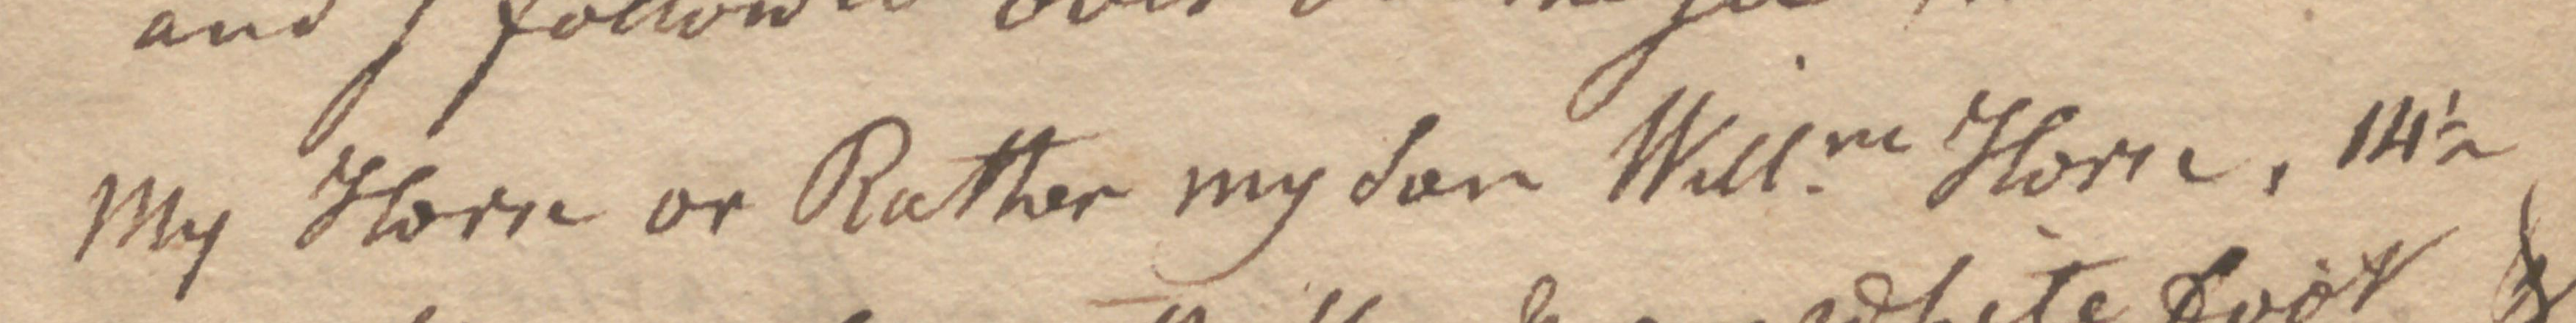My Horse or Rather my Son Will^m. Horse, 14 1/2
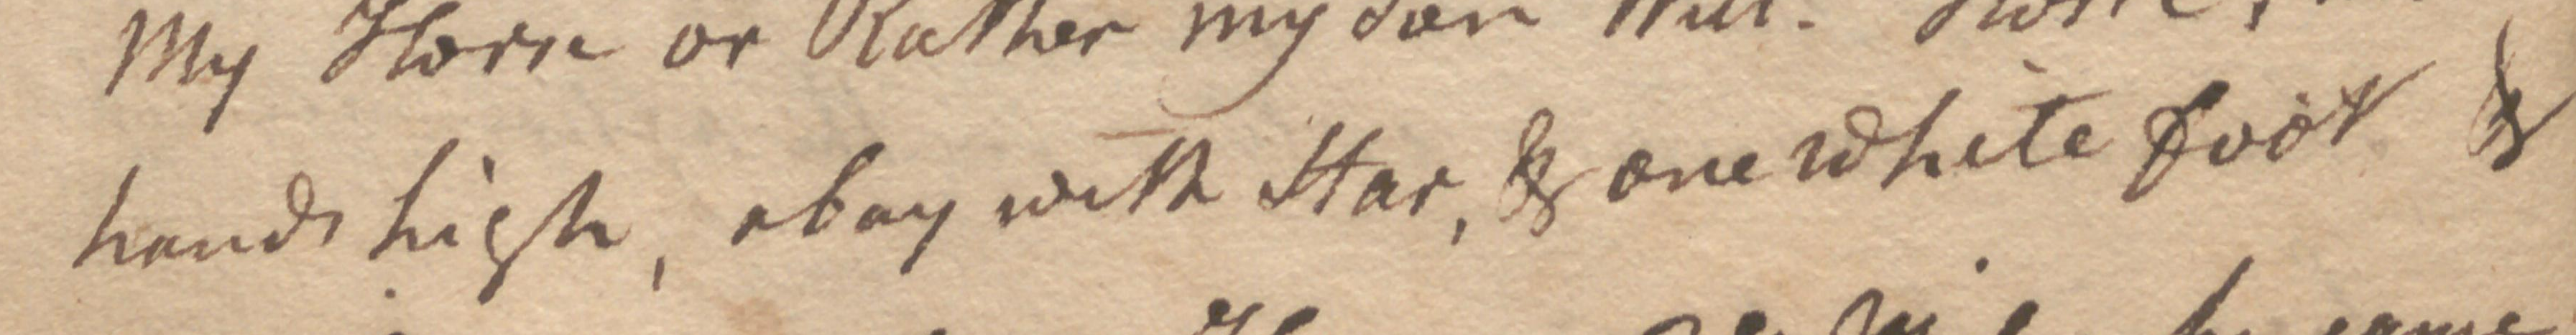hands high, a bay with star & one white foot &
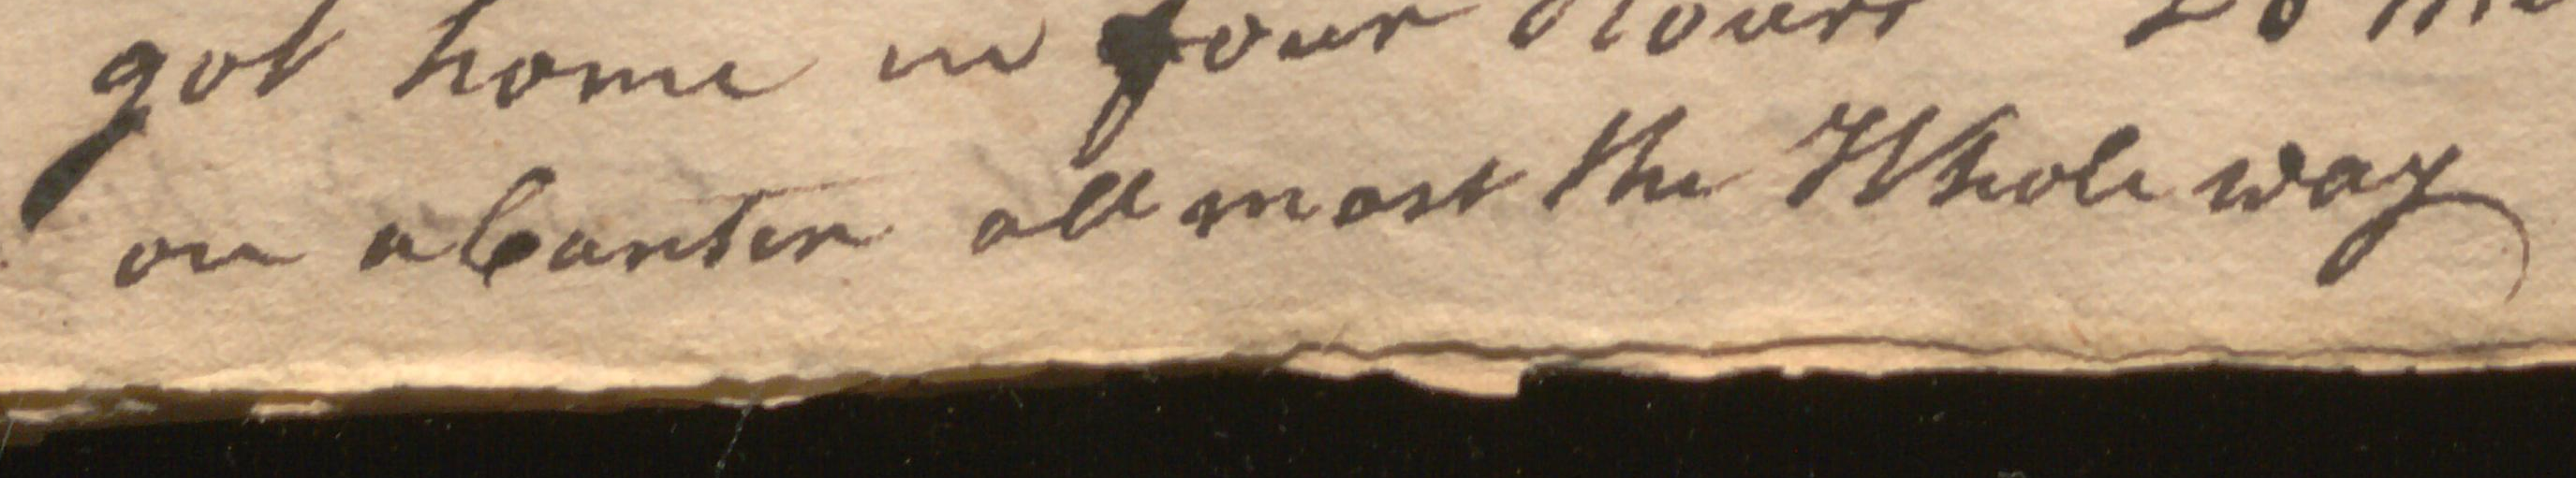on a Canten all most the Whole way
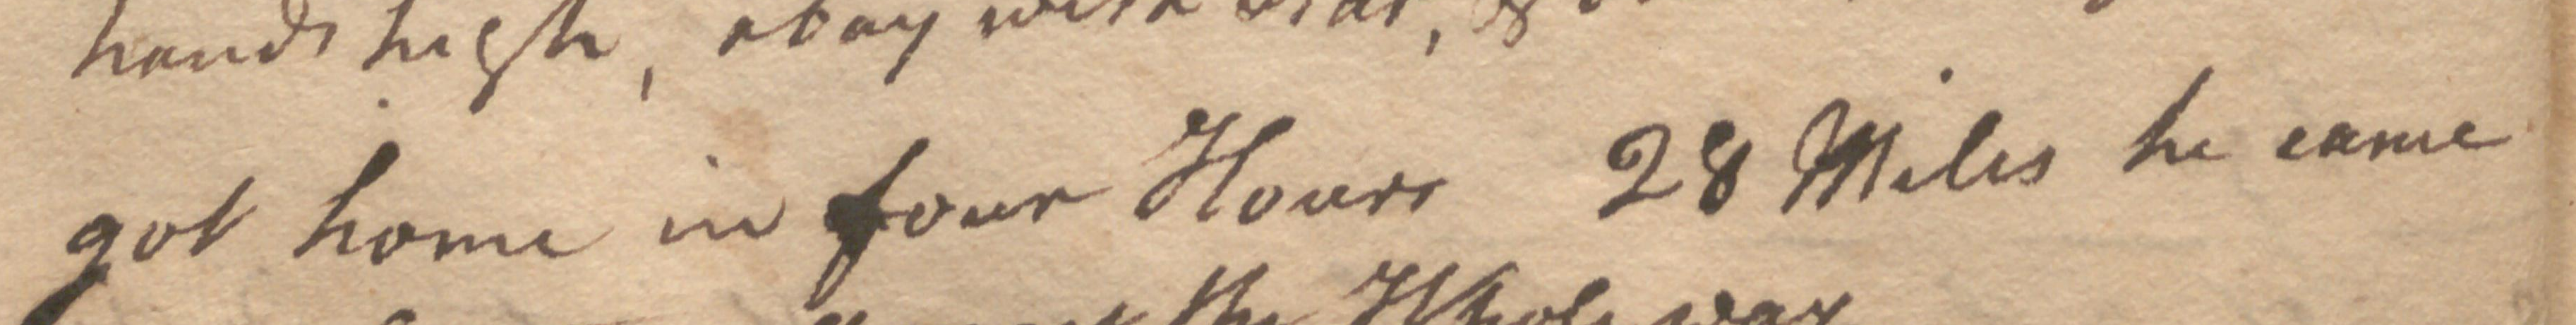got home in four Hours 28 Miles he came
